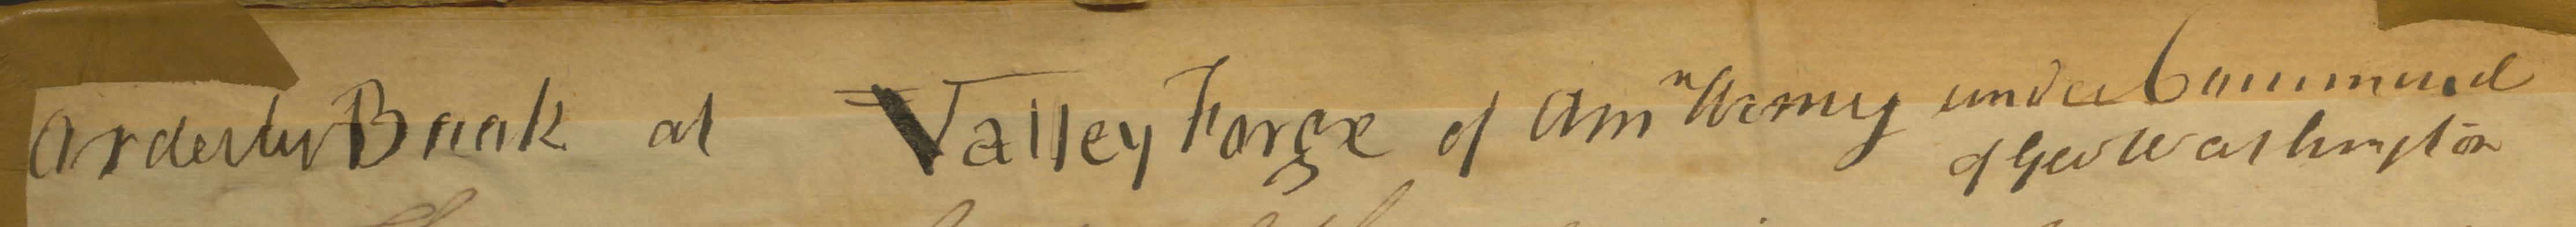Orderly Book at Valley Forge of Am^n Army under Command
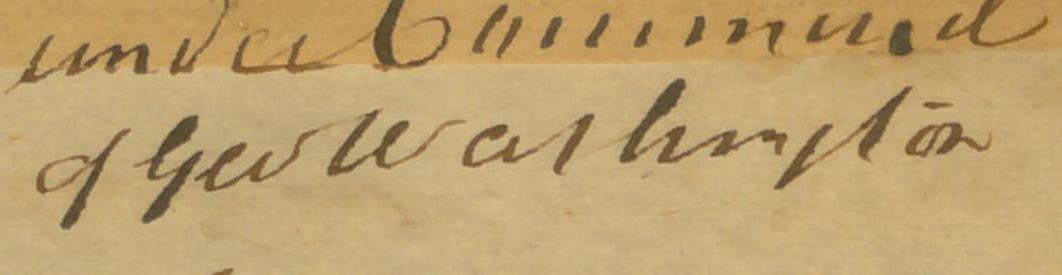of Gen Washington
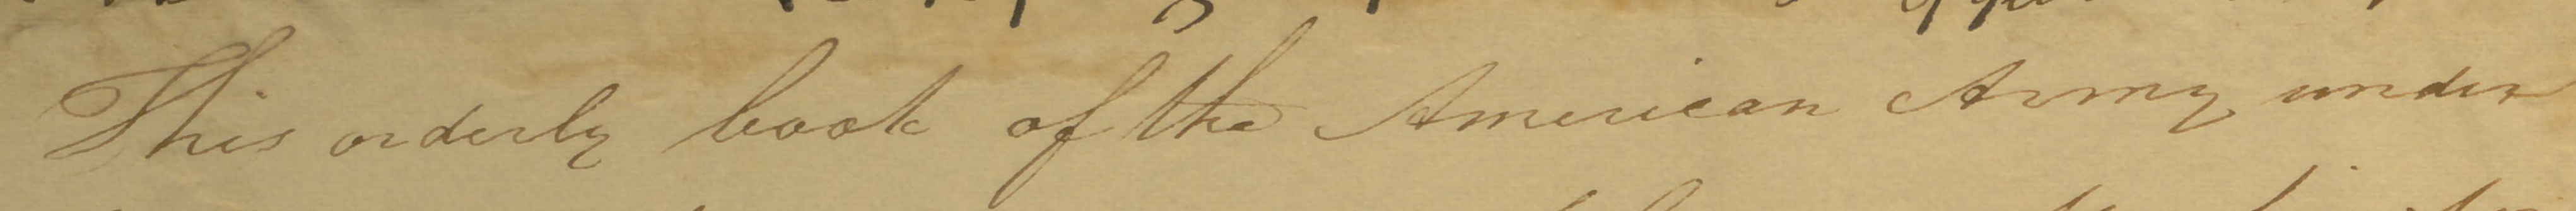This orderly book of the American Army under
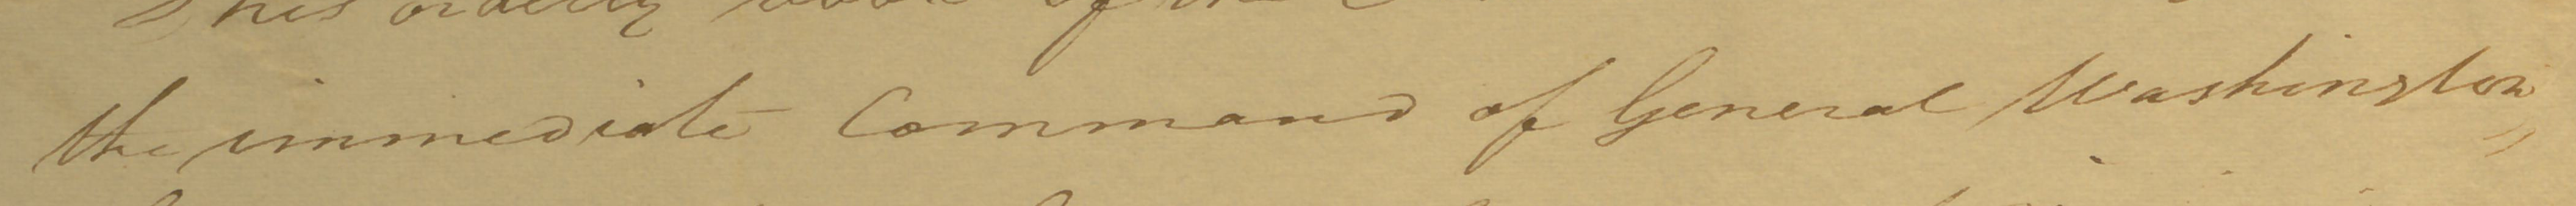the immediate Command of General Washington
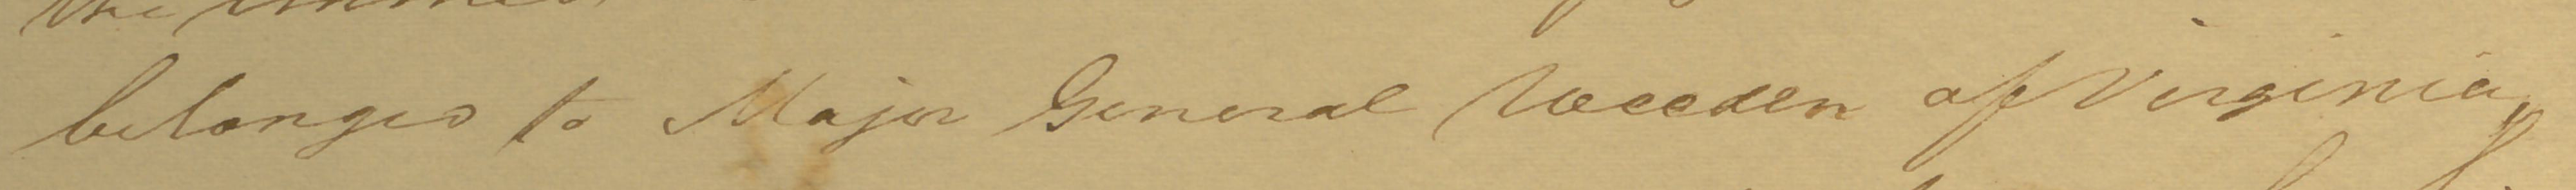belongs to Major General Weedon of Virginia,
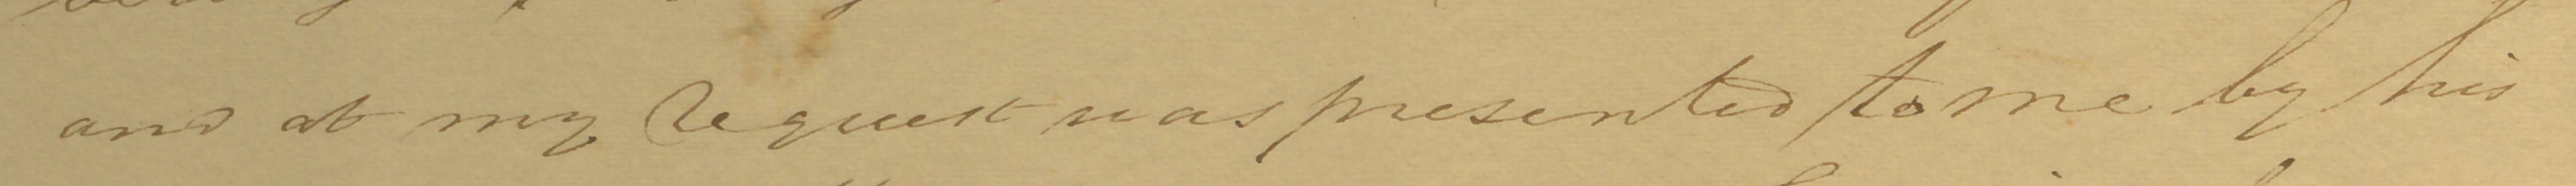and at my request was presented to me by his
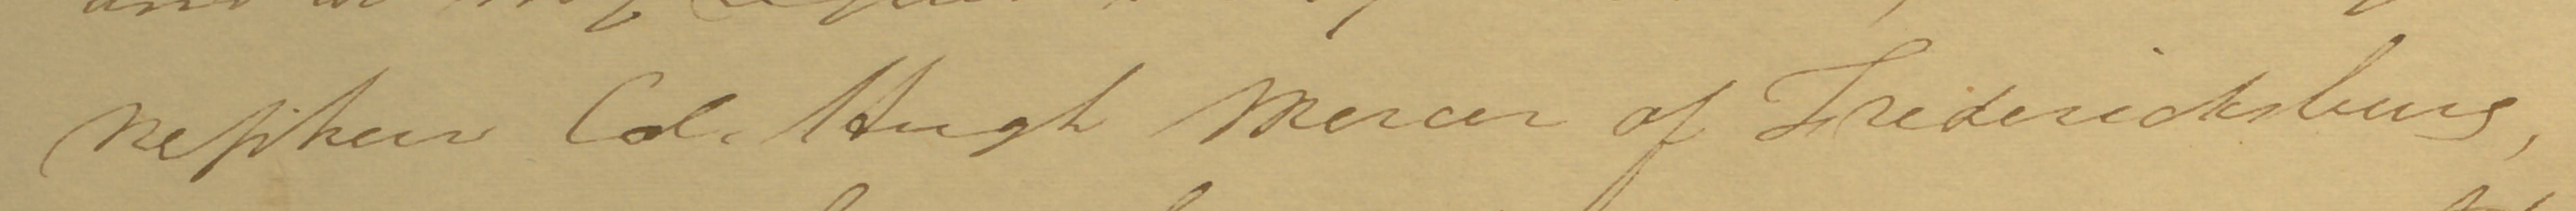nephew Col Hugh Mercer of Fredericksburg
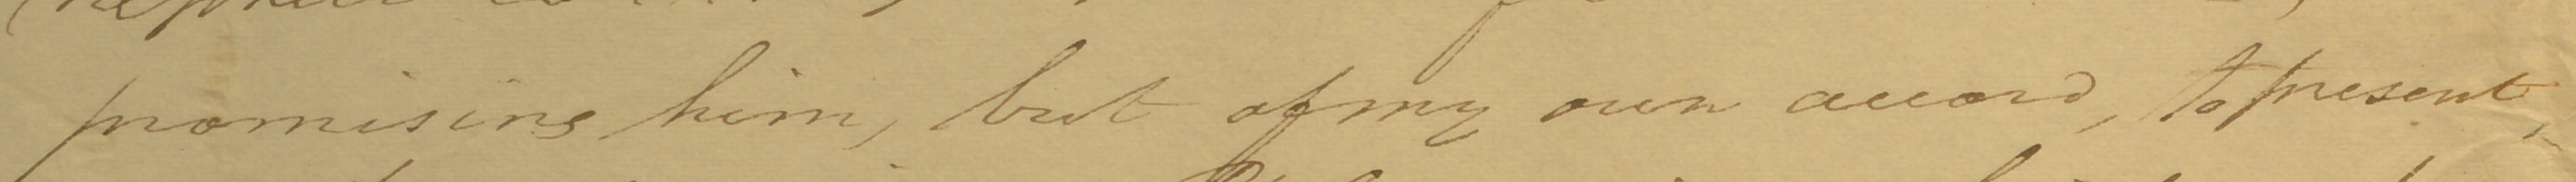promising him, but of my own accord, to present
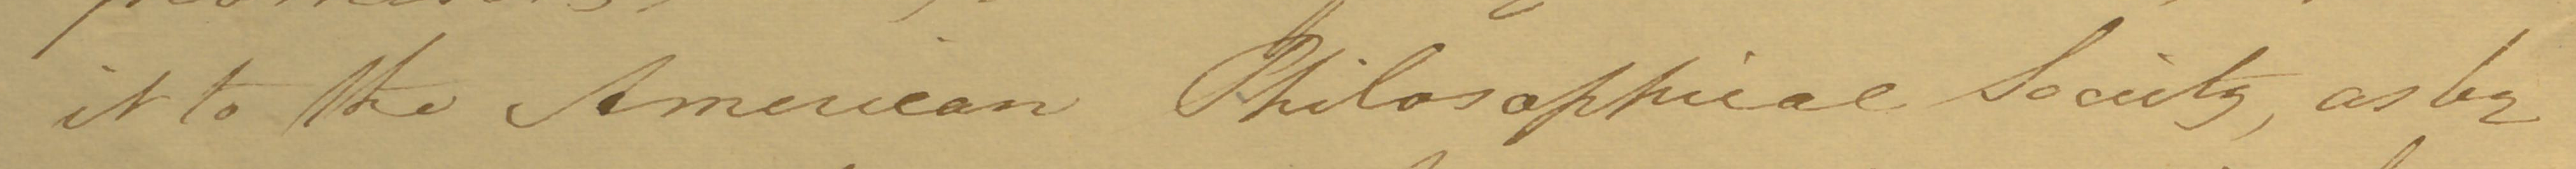it to the American Philosophical Society, as by
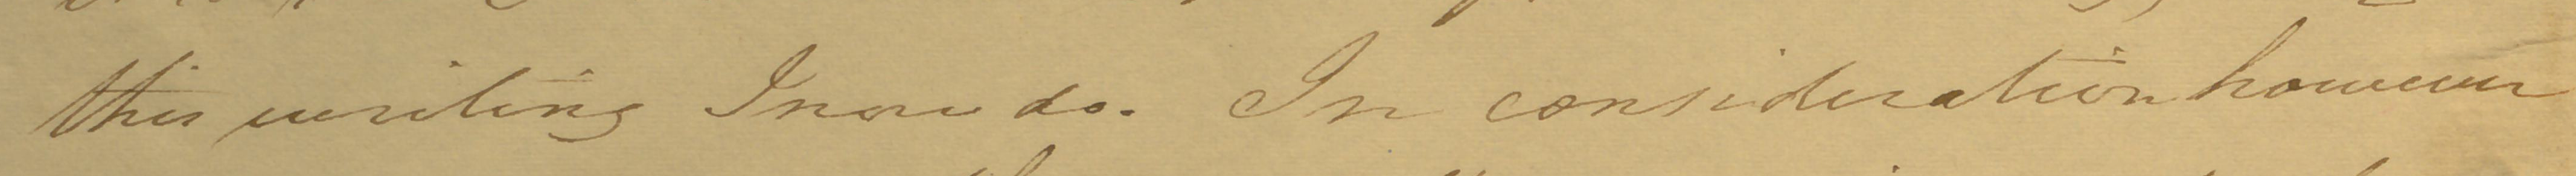this writing I now do. In consideration however
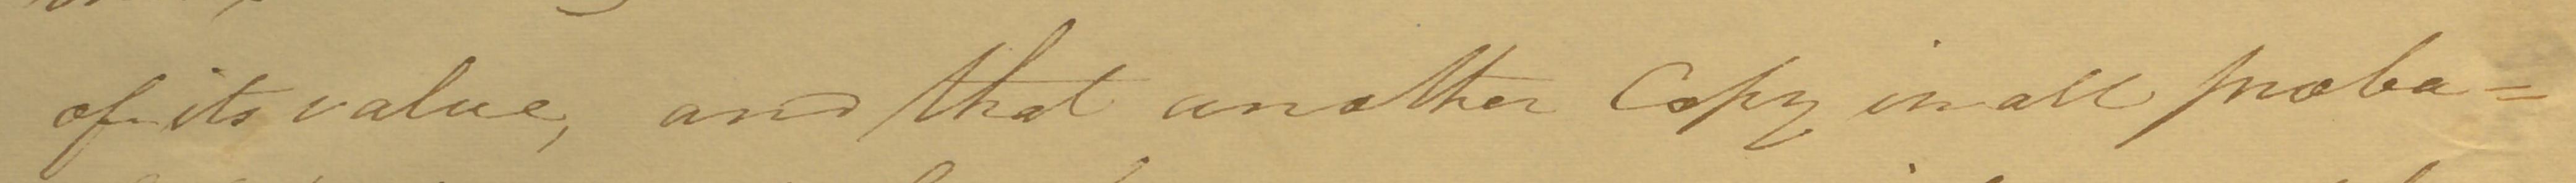of its value, and that another Copy in all proba-
